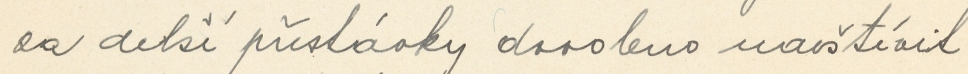za delší přestávky dovoleno navštívit
